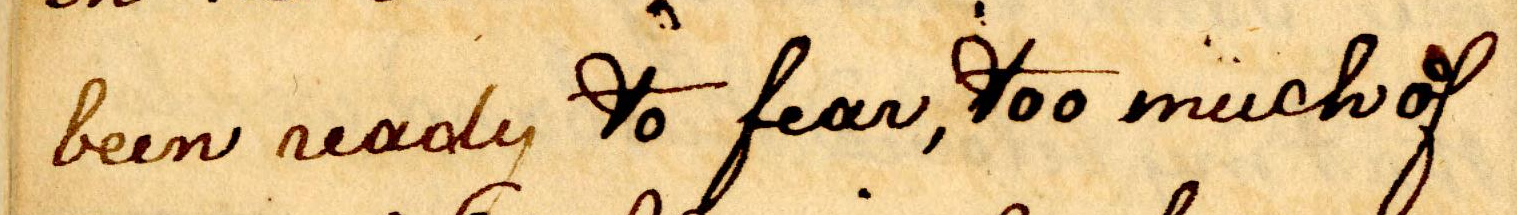been ready to fear, too much of
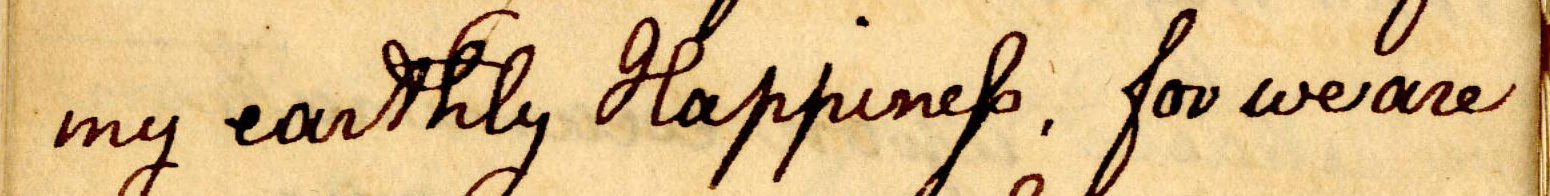my earthly Happiness, for we are
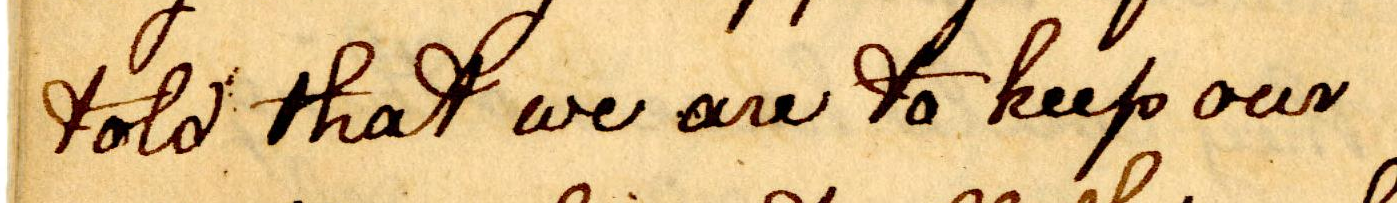told that we are to keep our
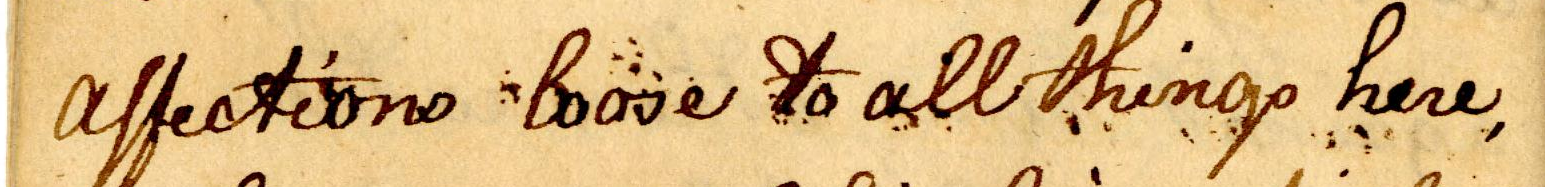Affections loose to all things here,
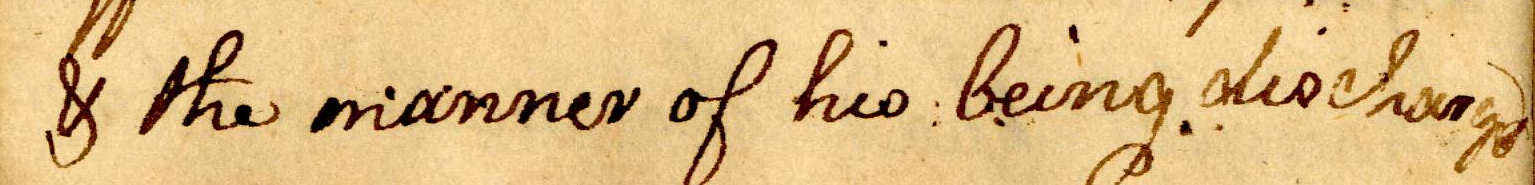& the manner of his being dischargd
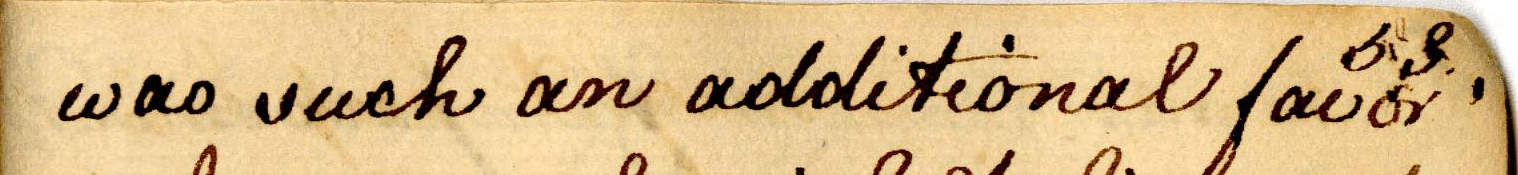was such an additional favor
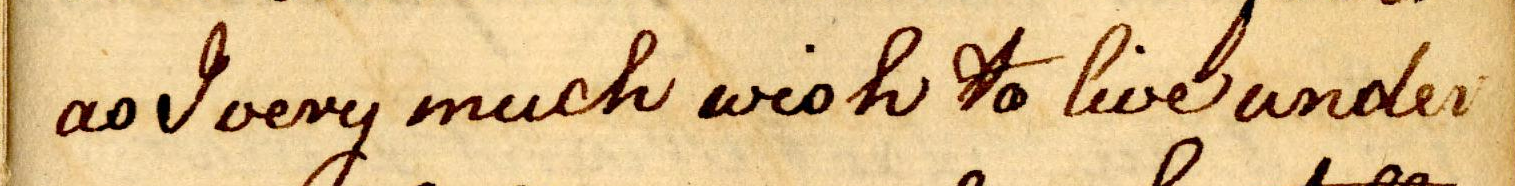as I very much wish to live under
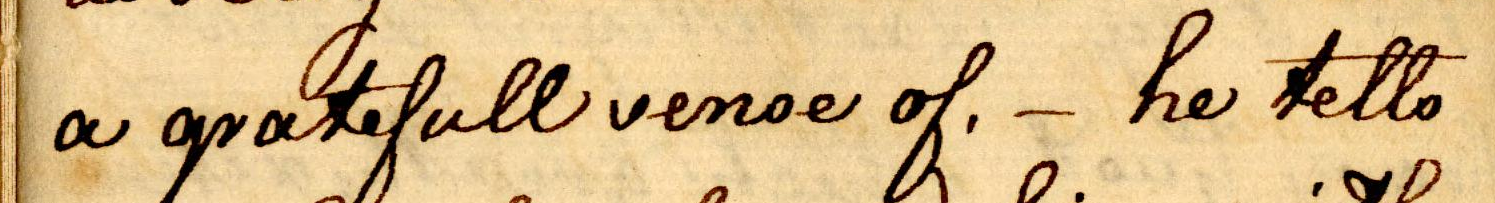a gratefull sense of,- he tells
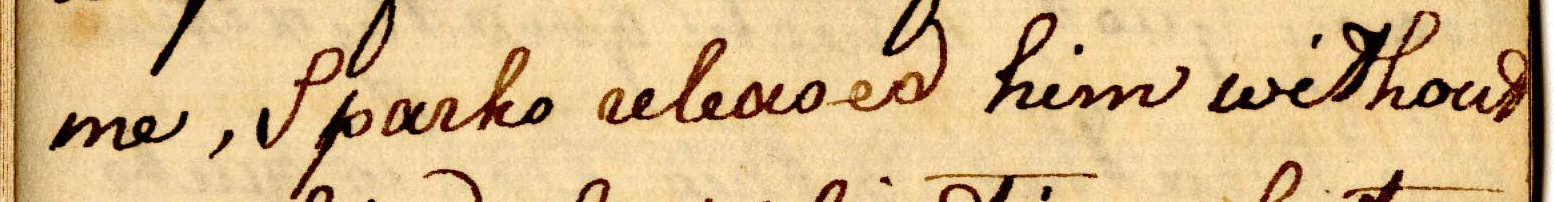me, Sparks released him without
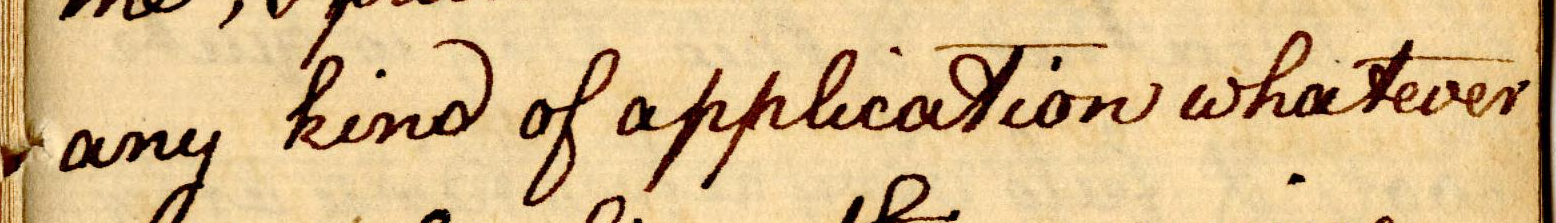any kind of application whatever
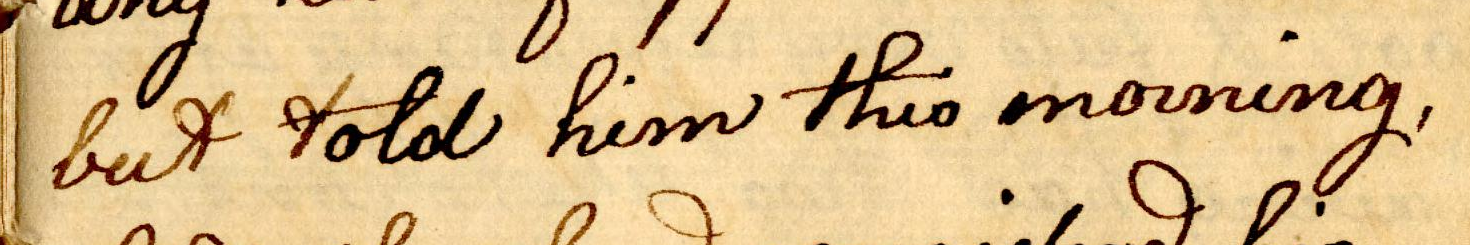but told him this morning,
